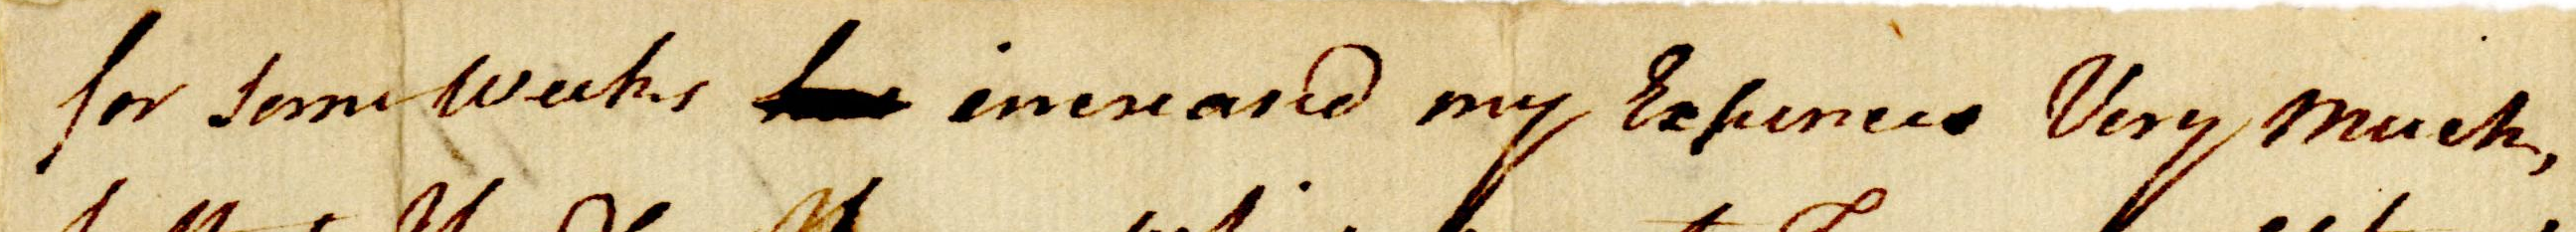for Some Weeks [___] increased my Expences Very much
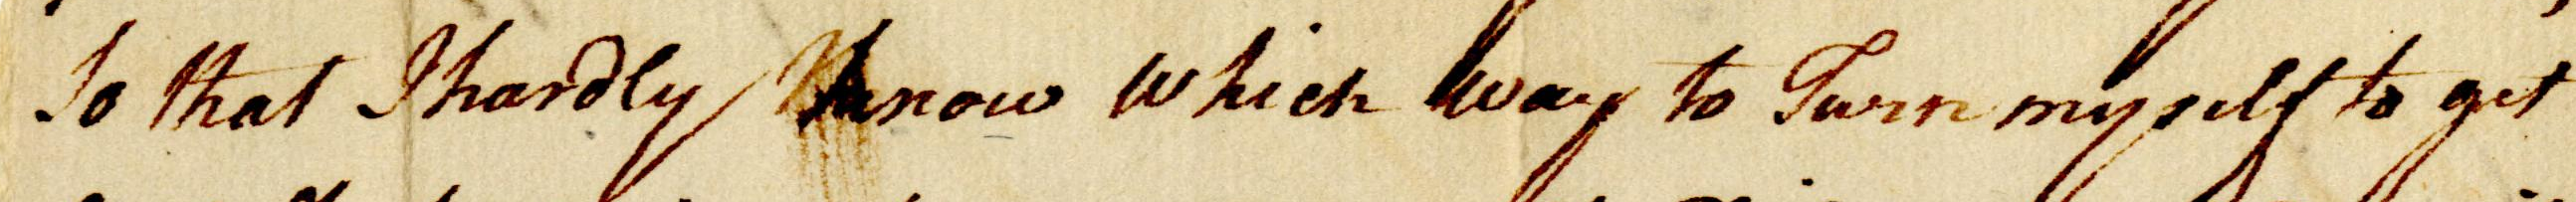so that I hardly Know which Way to Turn myself to get
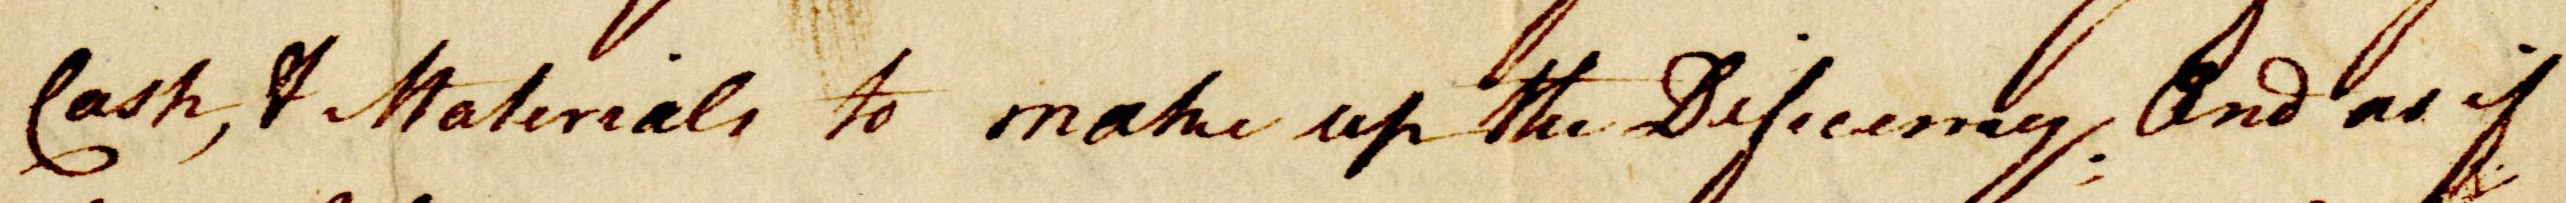Cash, & Materials to make up the Disscerny. And as if
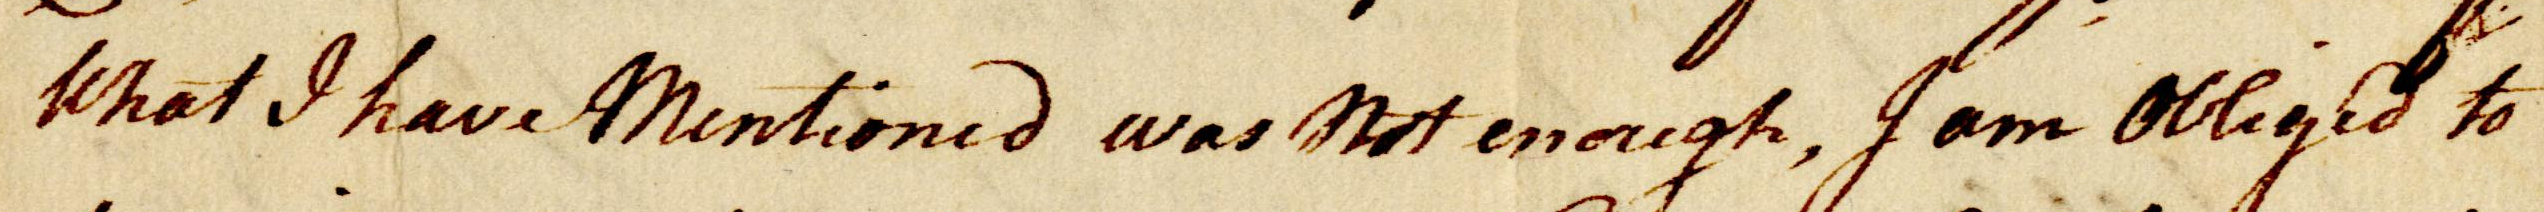What I have Mentioned was not enough, I am obliged to
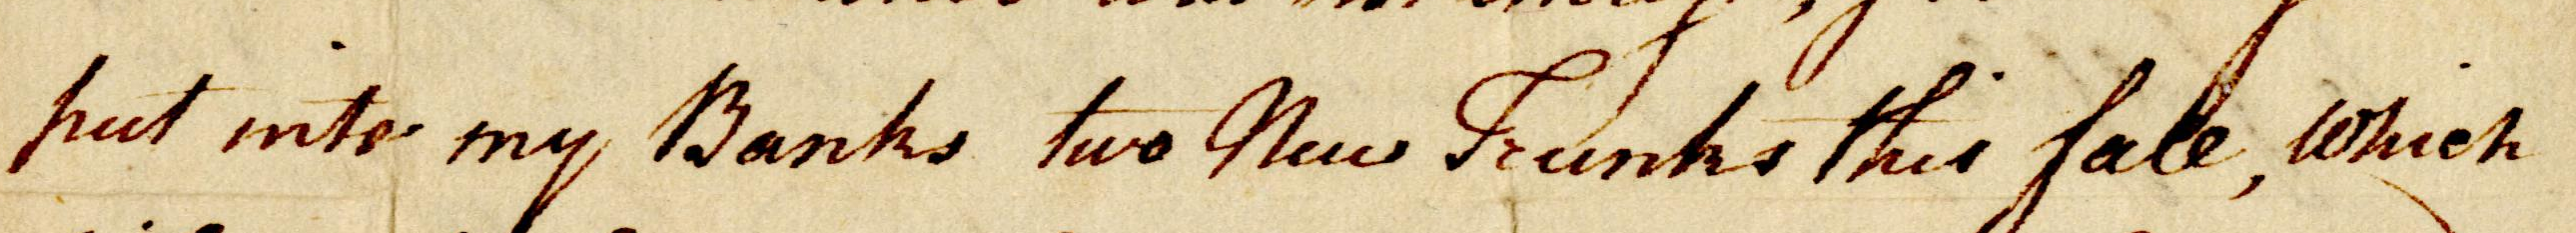put into my Banks two New Franks this fall, which
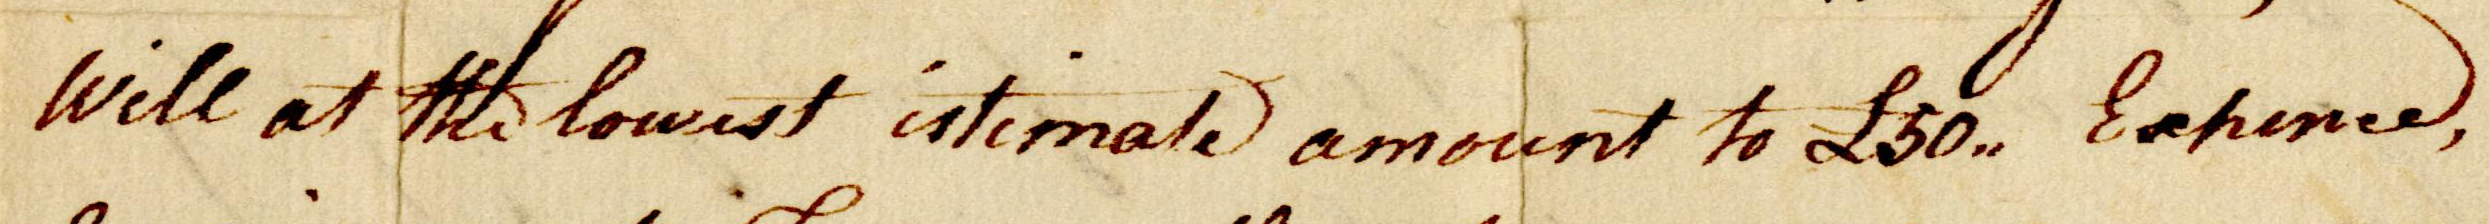will at the lowest estimate amount to £50.. Expence,
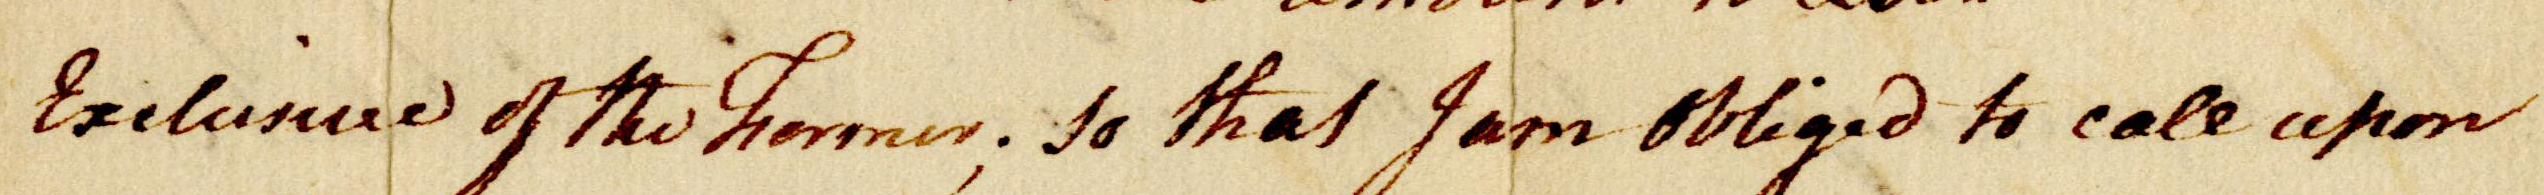Exclusive of the Former. so that I am obliged to call upon
